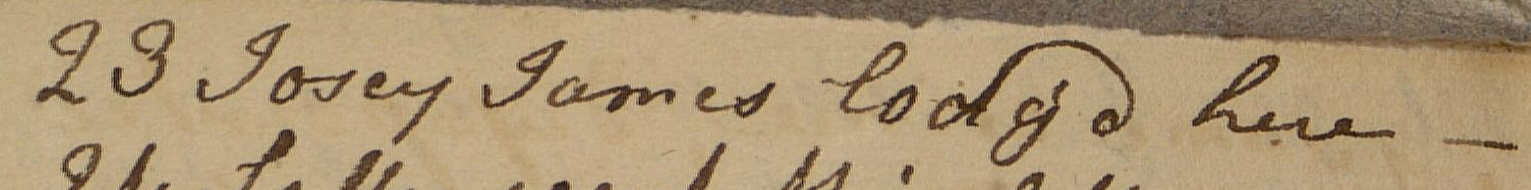23 Josey James lodg'd here-
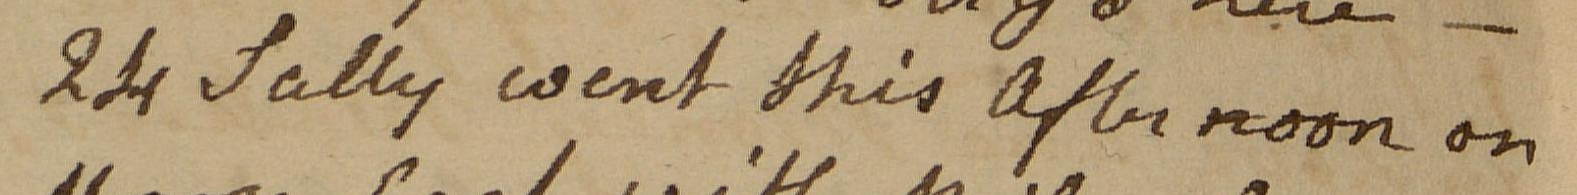24 Sally went this Afternoon on
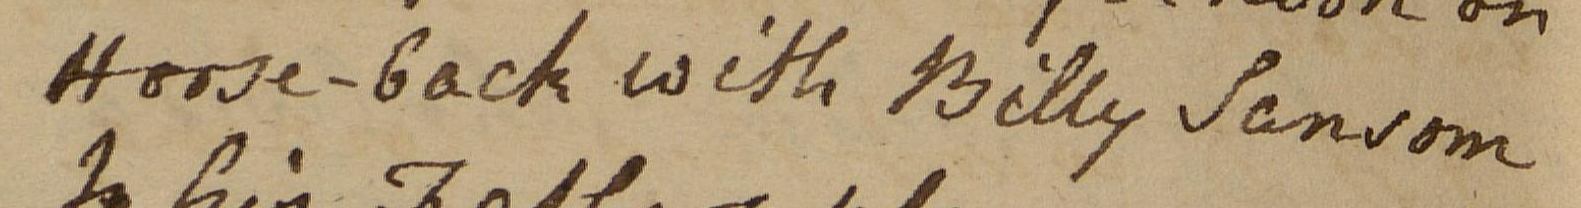Horse-back with Billy Sansom
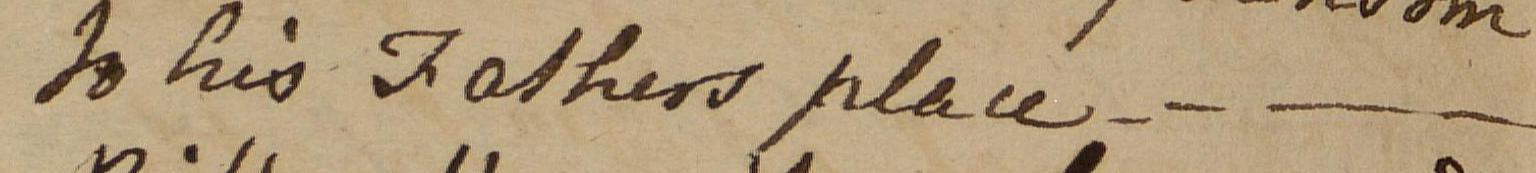to his Fathers place-
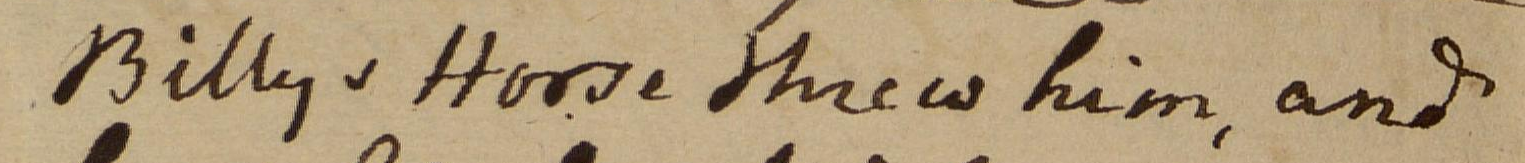Billys Horse threw him, and
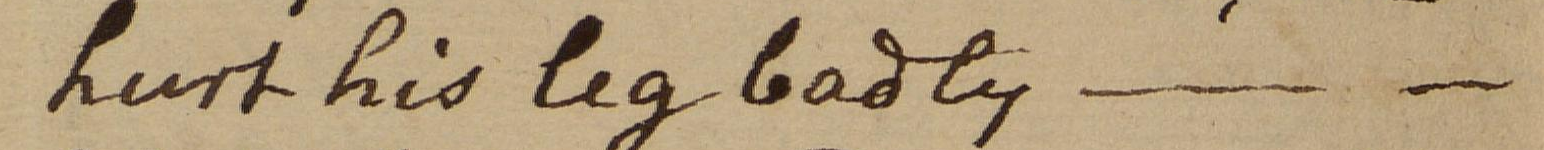hurt his leg badly-
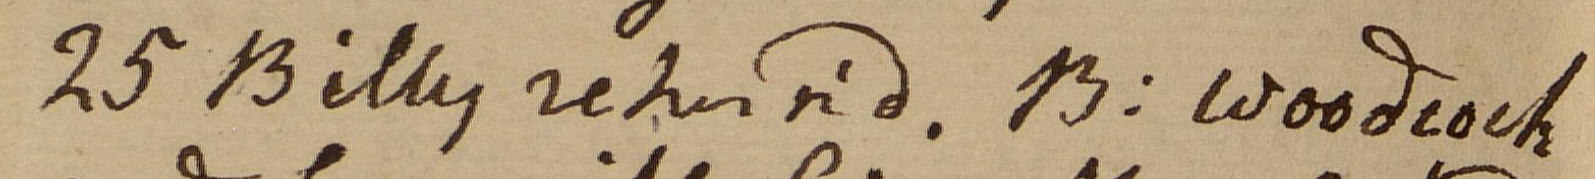25 Billy return'd. B. Woodcock
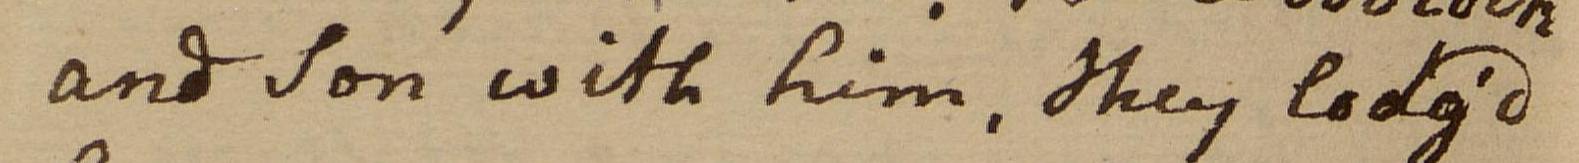and Son with him, they lodg'd
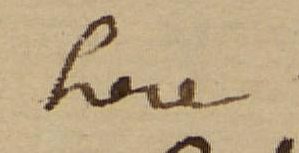here
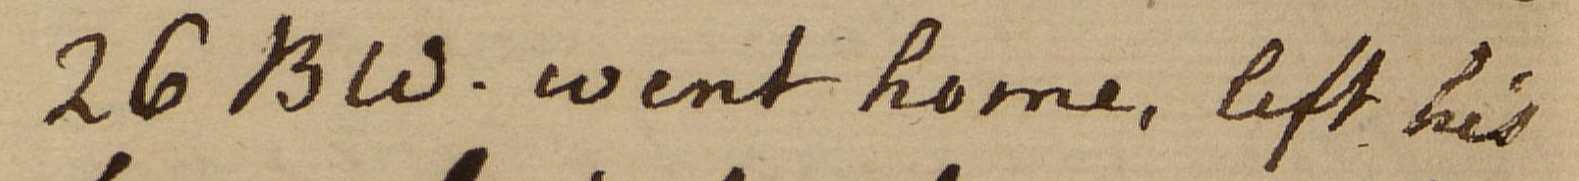26 BW. went home, left his
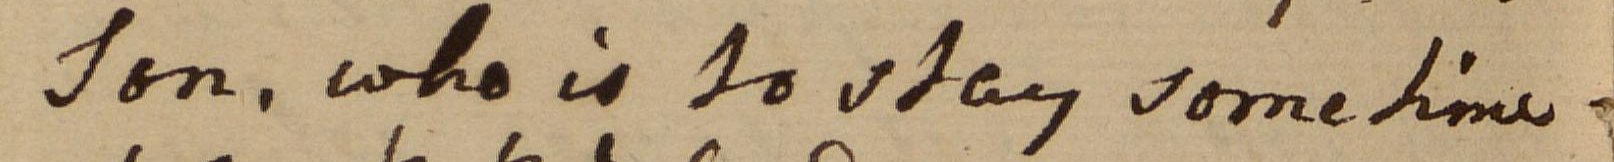Son, who is to stay some time
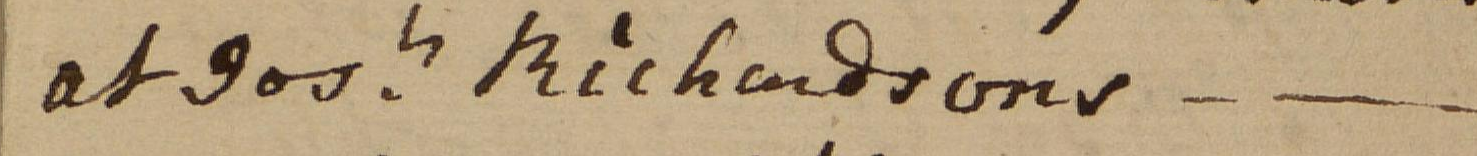at Jos^h. Richerdsons-
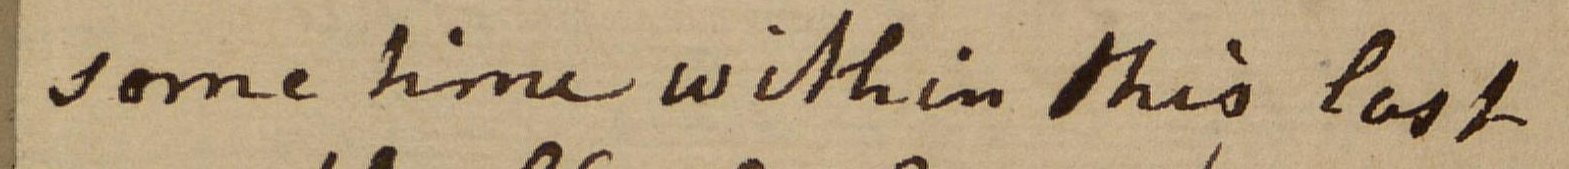some time within this last
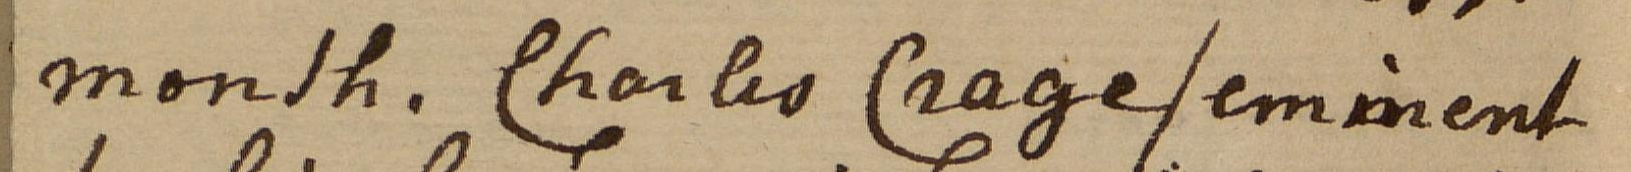month. Charles Crage /eminent
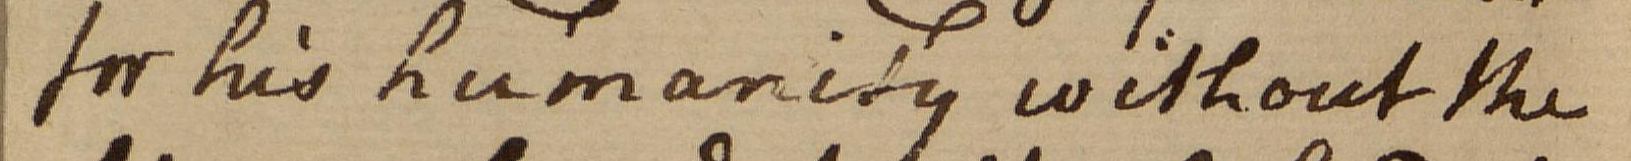for his humanity without the
